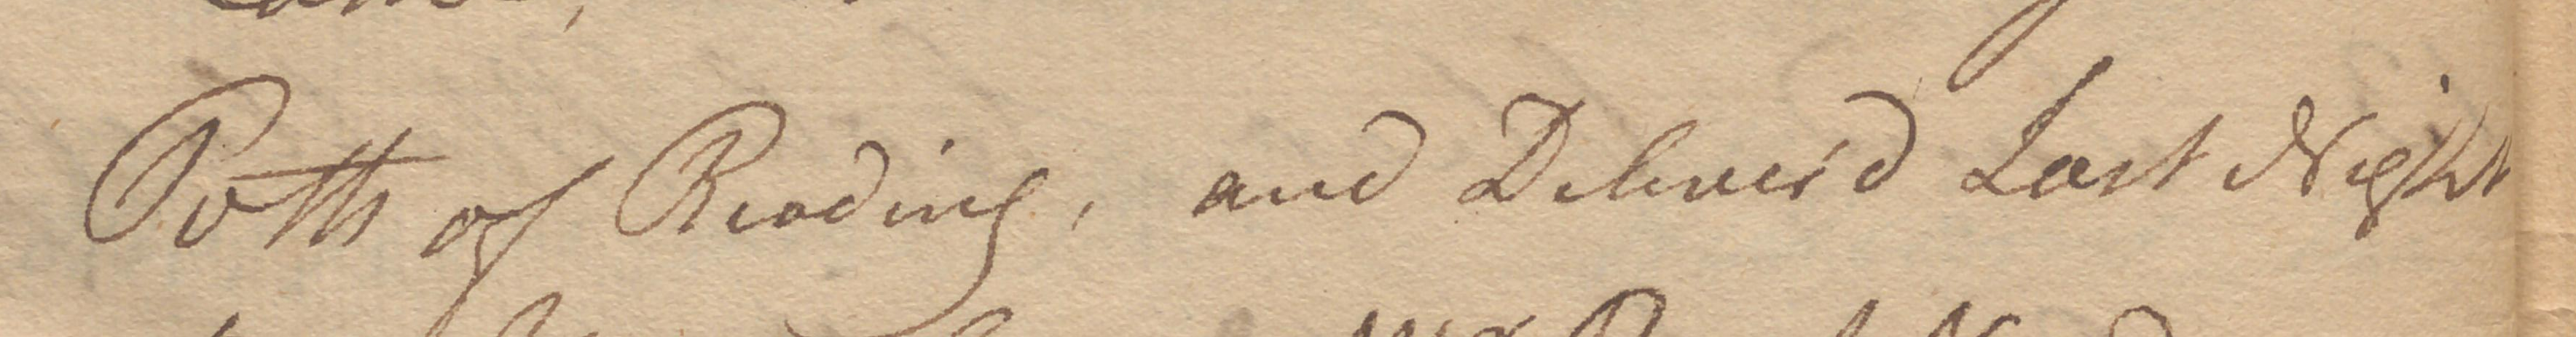Potts of Reading, and Deliver'd Last Night
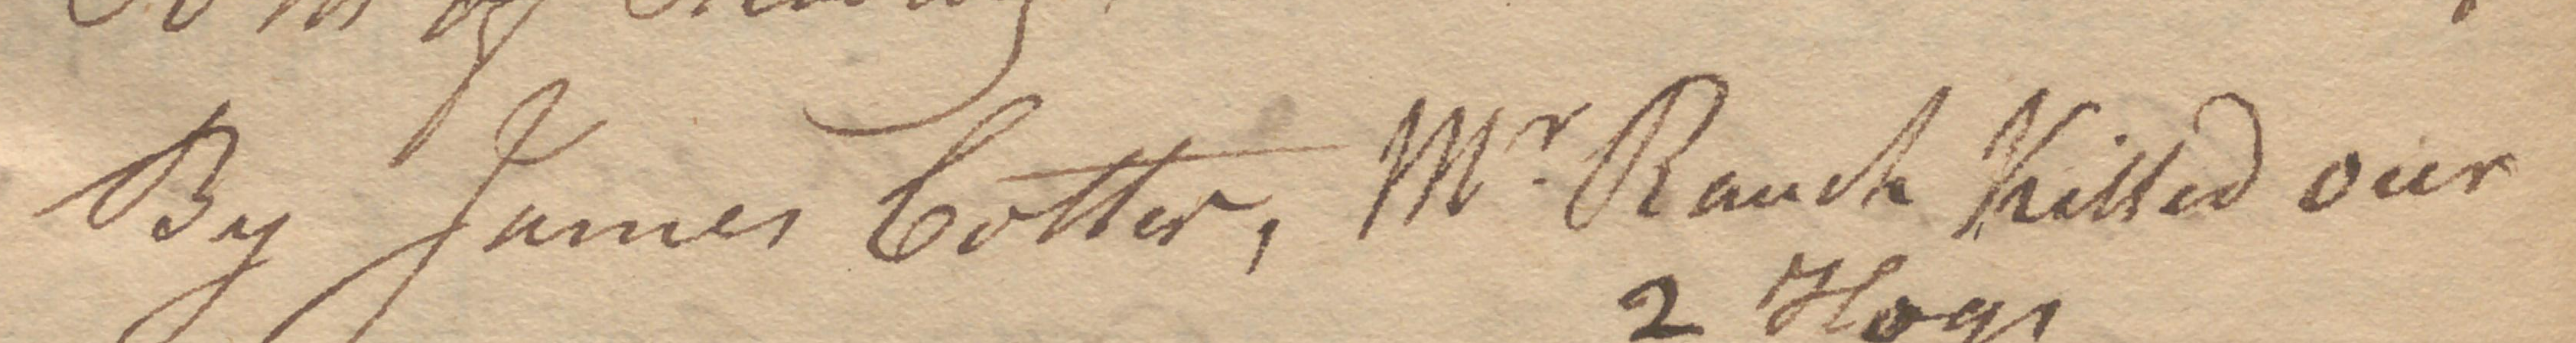By James Cotter, M^r. Rauch Killed our
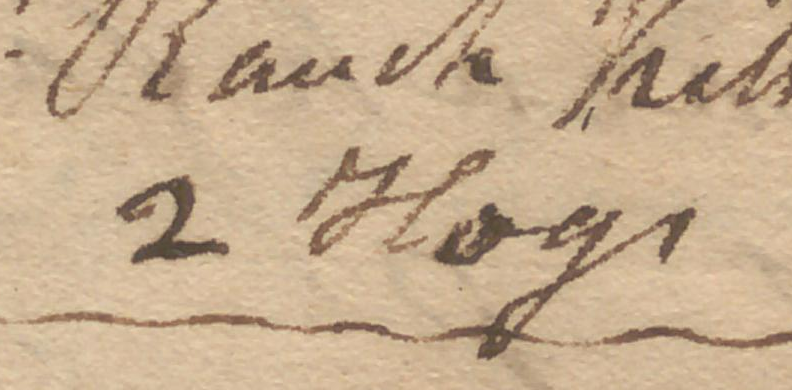2 Hogs
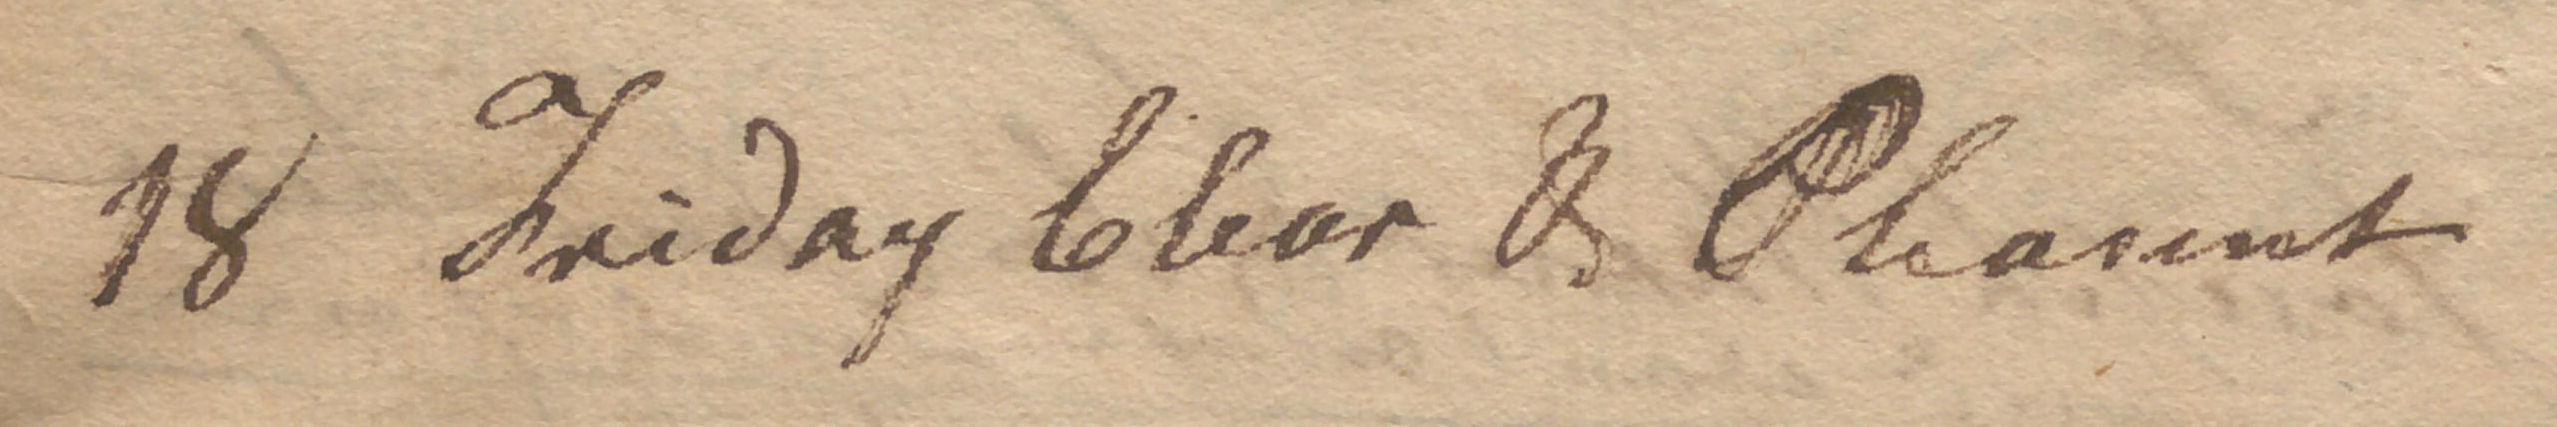18 Friday Clear & Pleasent
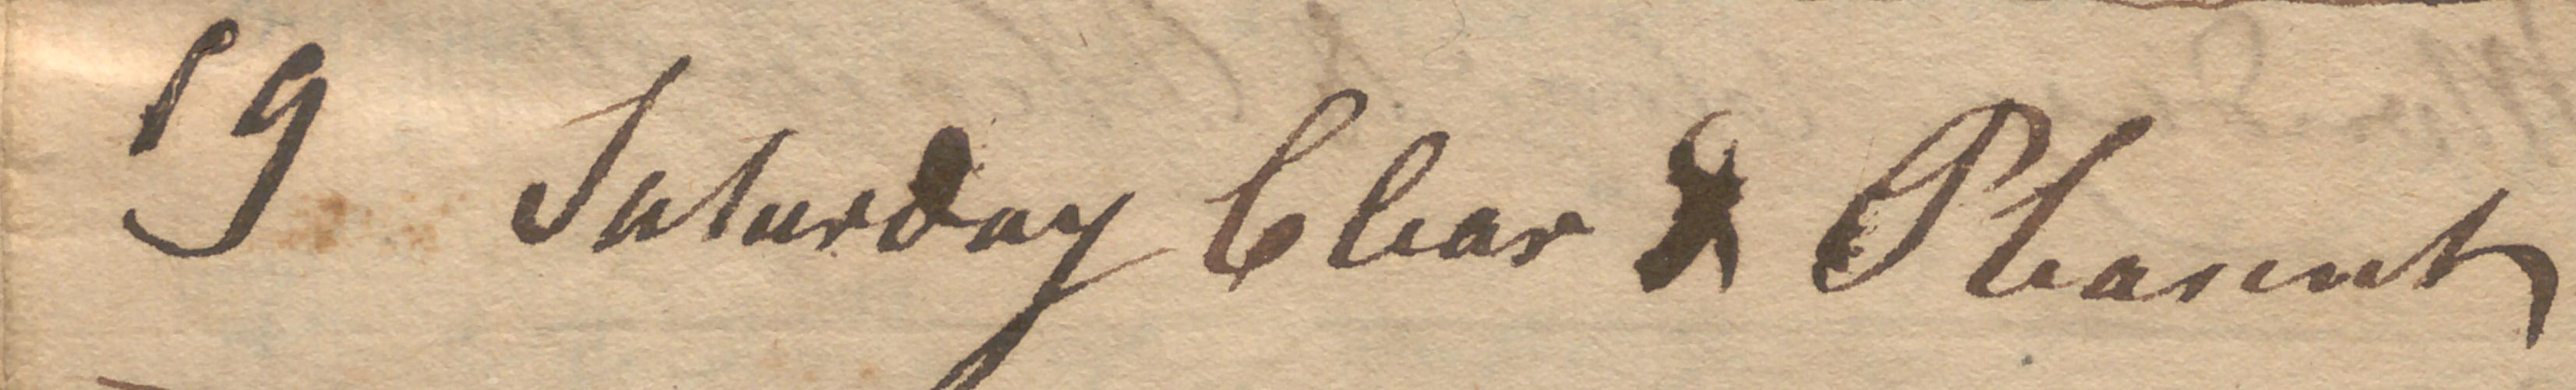19 Saturday Clear & Pleasent
